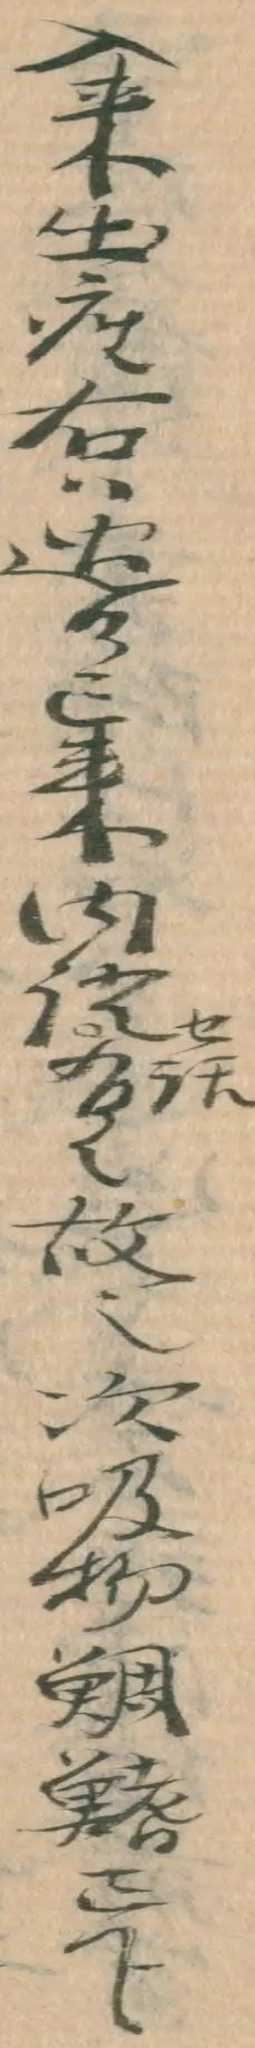入来出座右ハ過候已来内證世話有之故也次吸物鯛鰭已下
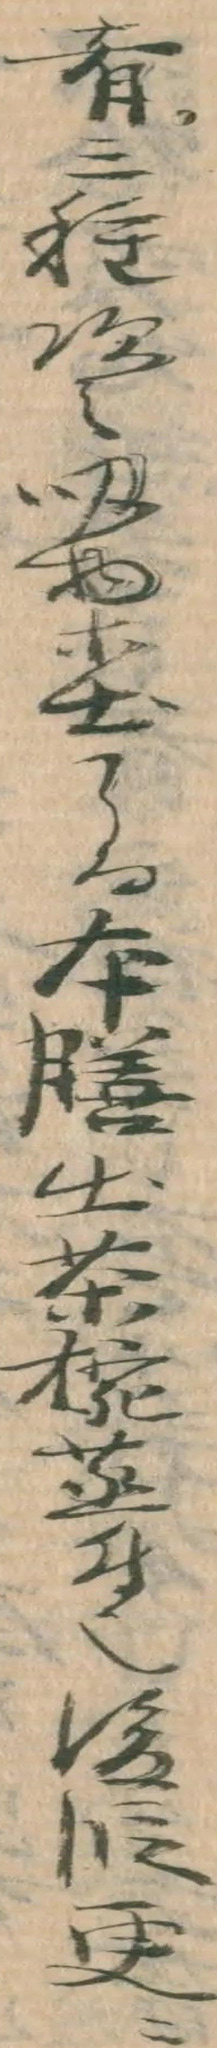肴三種次之吸物等出了而本膳出茶碗蒸付也後段更に
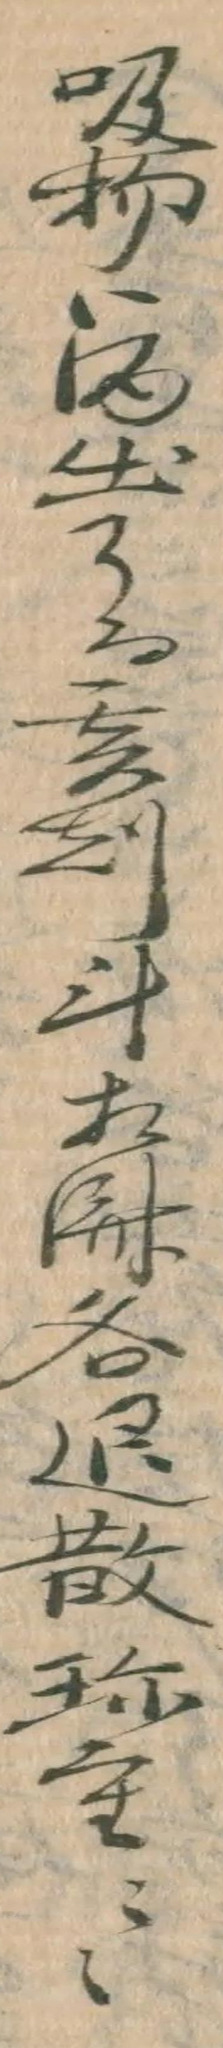吸物御酒出了而亥刻斗相済各退散珍重々々
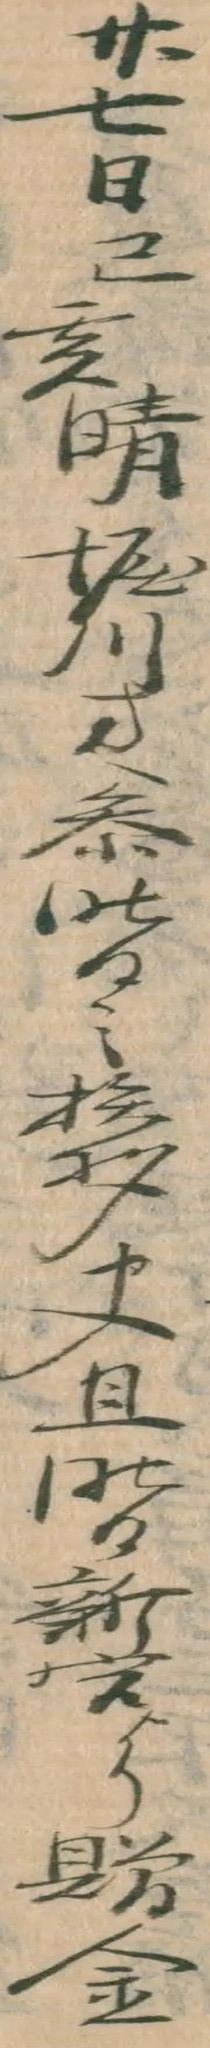廿七日己亥晴堀川方へ参昨日之挨拶申入且昨日新宮より贈金
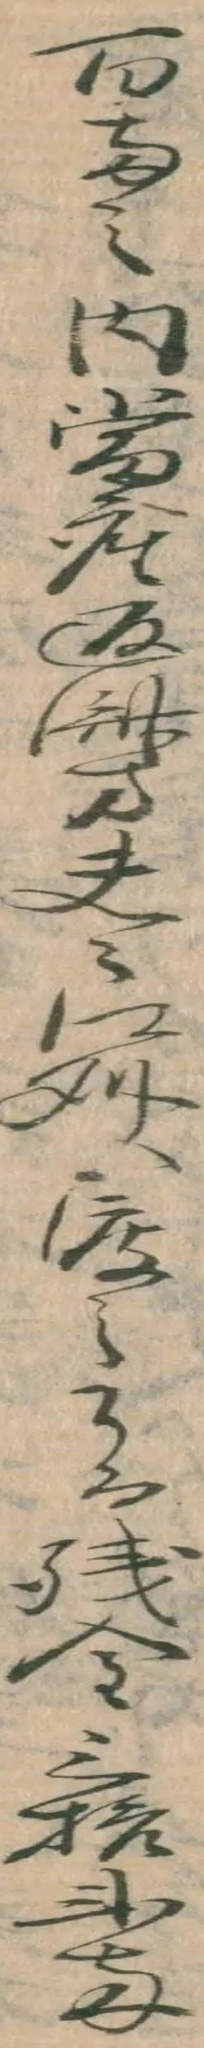百両之内當座返済方夫々江州へ渡之了而残金三拾弐両
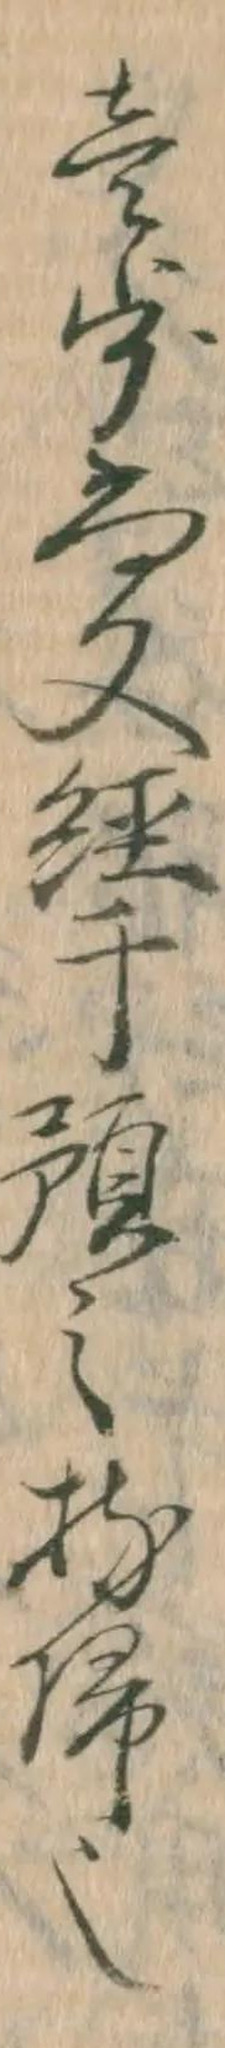壱歩尚又経千預之持帰也
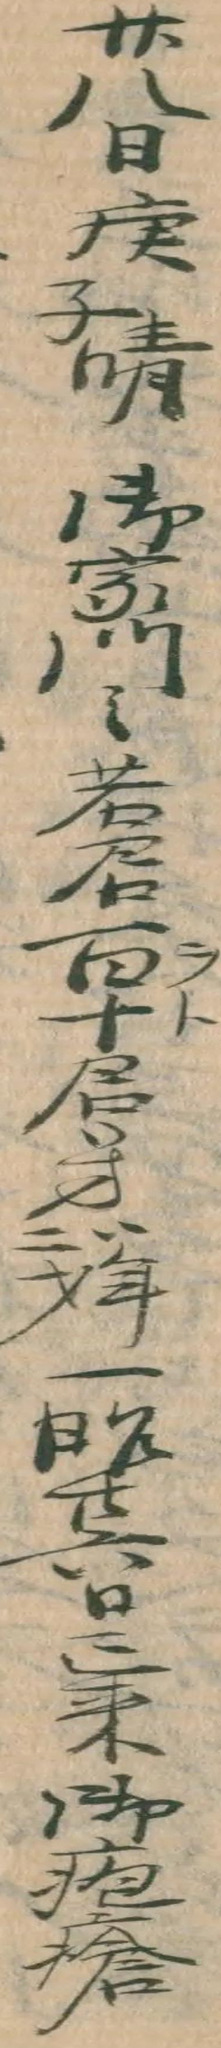廿八日庚子晴御家門之若君百十居方八年二才一昨廿六日已来御疱瘡
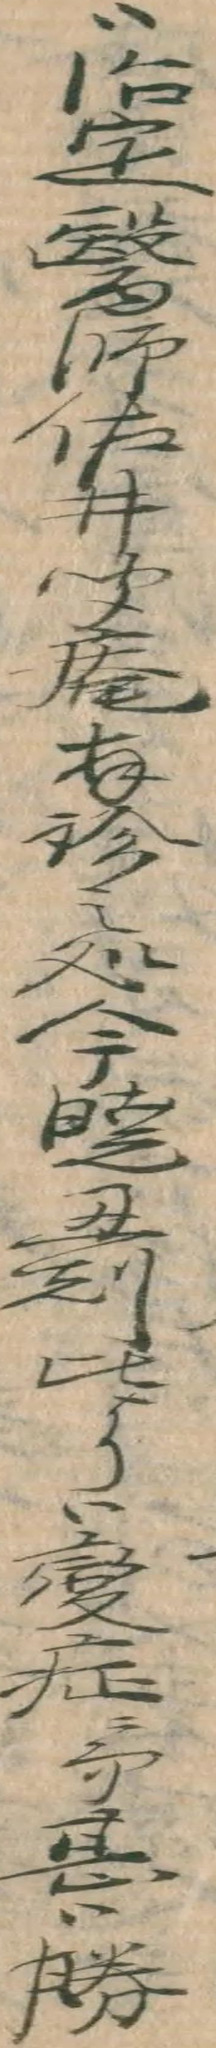御治定醫師佐井聞庵有診之処今暁丑刻比よりハ變症ニ而甚御勝
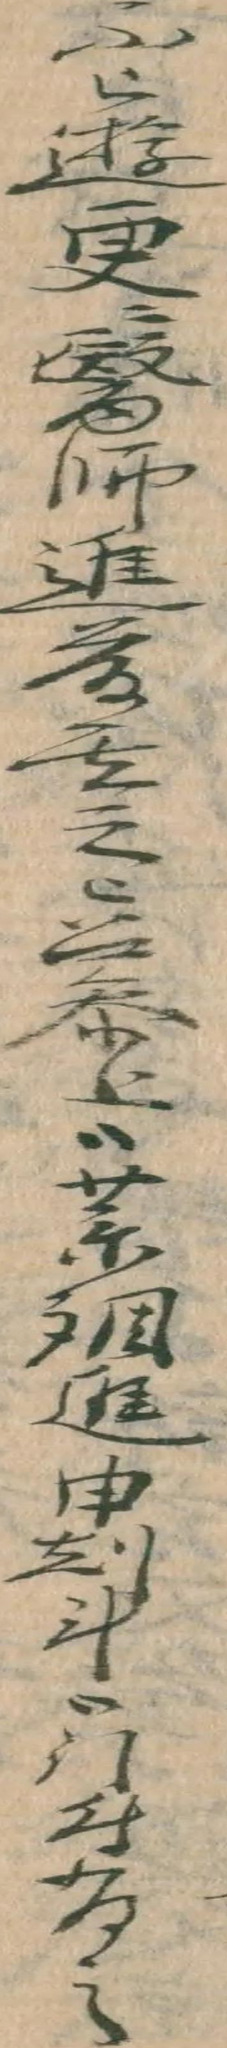不被遊更ニ醫師進藤玄之被仰参上ハ薬調進申刻計御引付有之
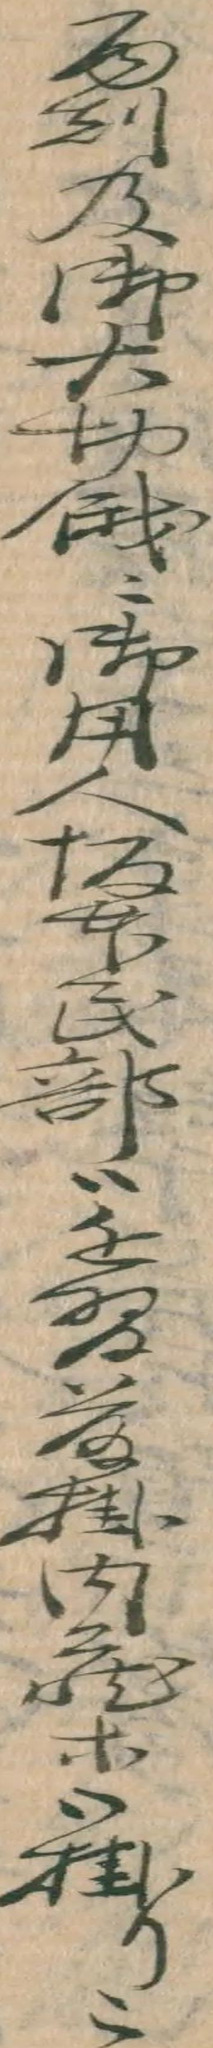酉刻及御大切俄ニ御用人坂本民部ハ近習藤掛内蔵等御掛り被
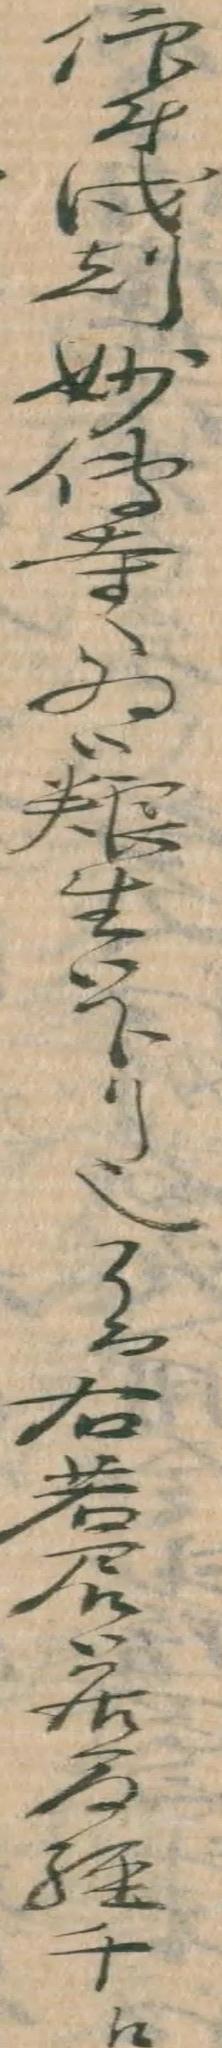仰付戌刻妙傳寺へ為御養生御下り也了而右若君御居間経千え
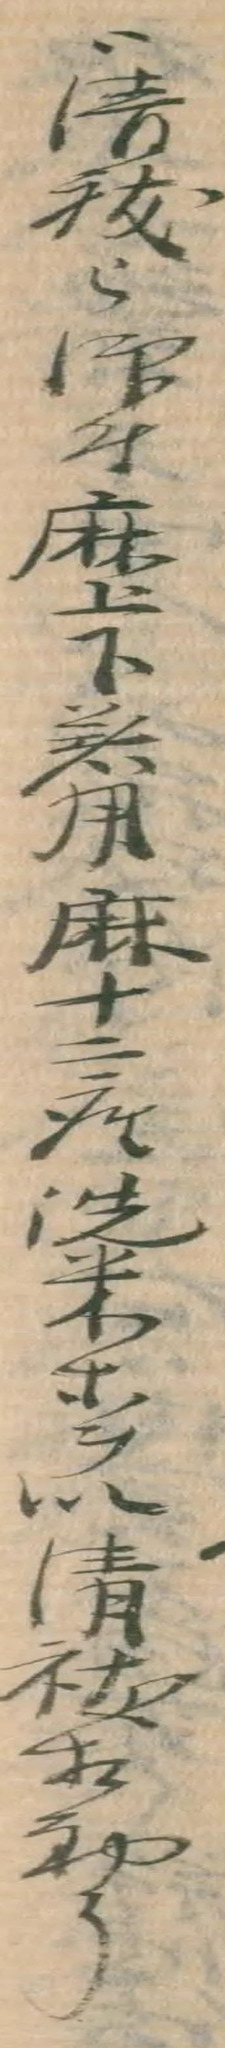御清祓被仰付麻上下着用麻十二座洗米等ヲ以清祓相勤了
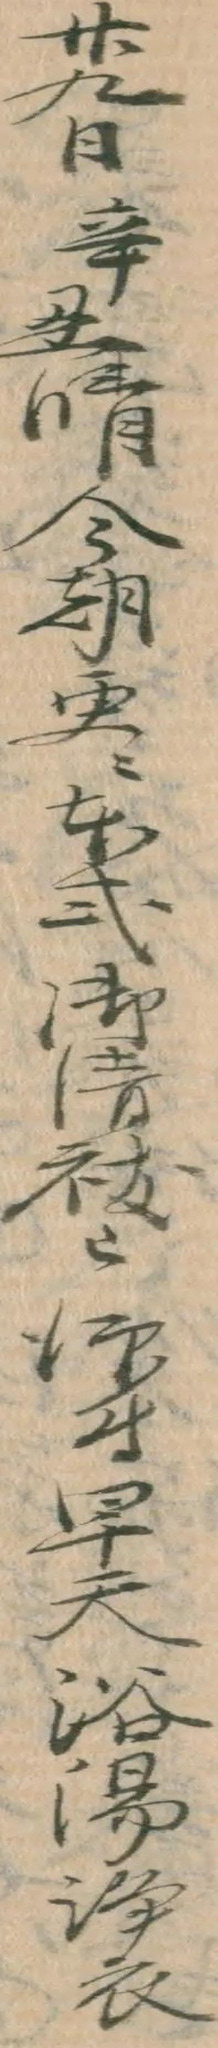廿九日辛丑晴今朝更ニ本式御情祓被仰付早天浴湯浄衣
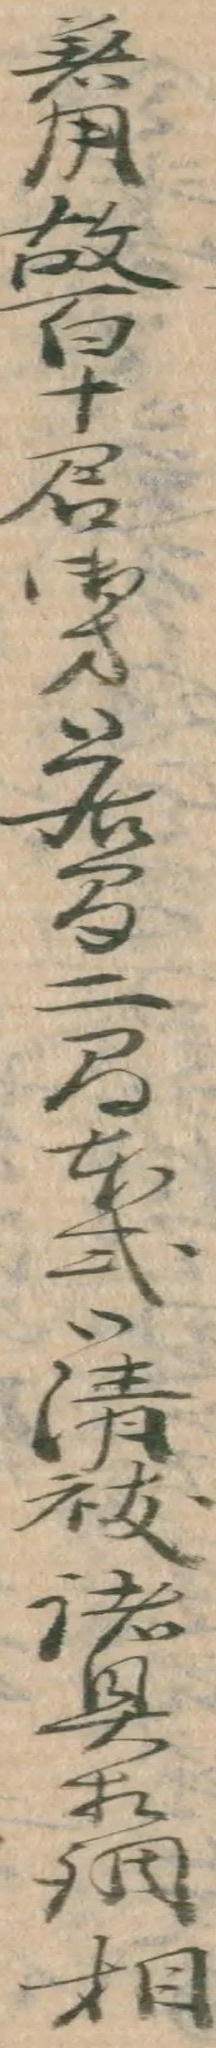着用故百十君御方御居間二間本式御清祓諸具相調相
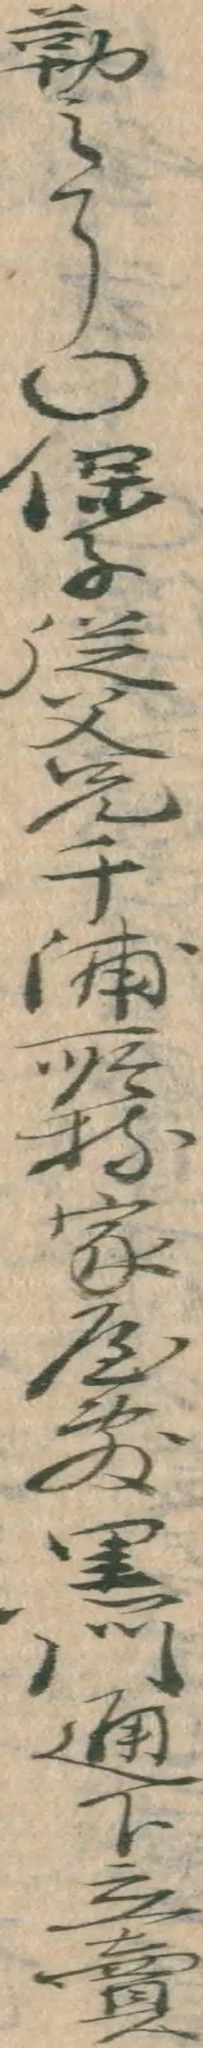勤之了○保子従父兄千浦所持家屋敷黒門通下立売
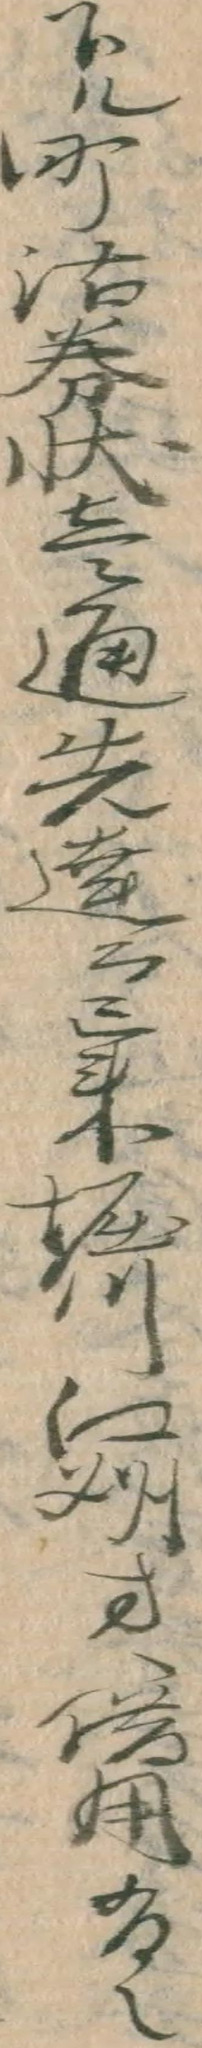下ル町沽券状壱通先達而已来堀川江州方へ借用有之
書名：賀茂社記録. 第65冊
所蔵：国立国会図書館 National Diet Library, JAPAN
